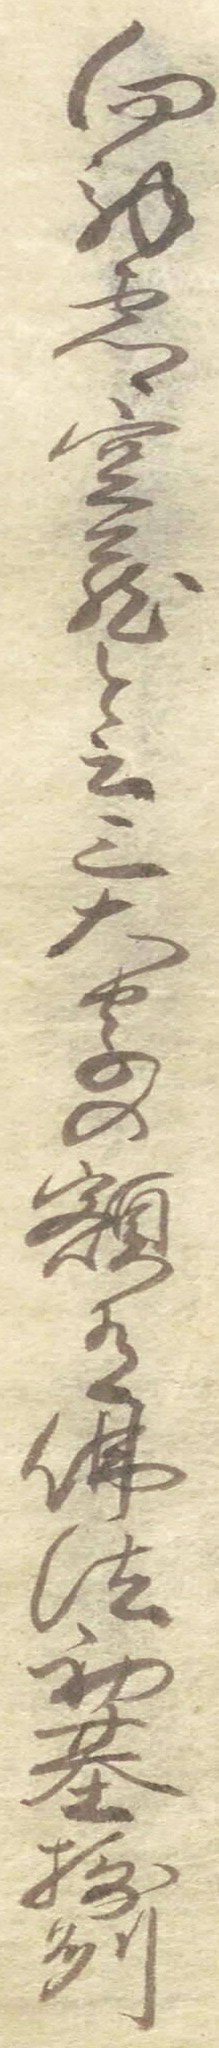向拝虚空蔵と云三大字の額有仏法初基摂州
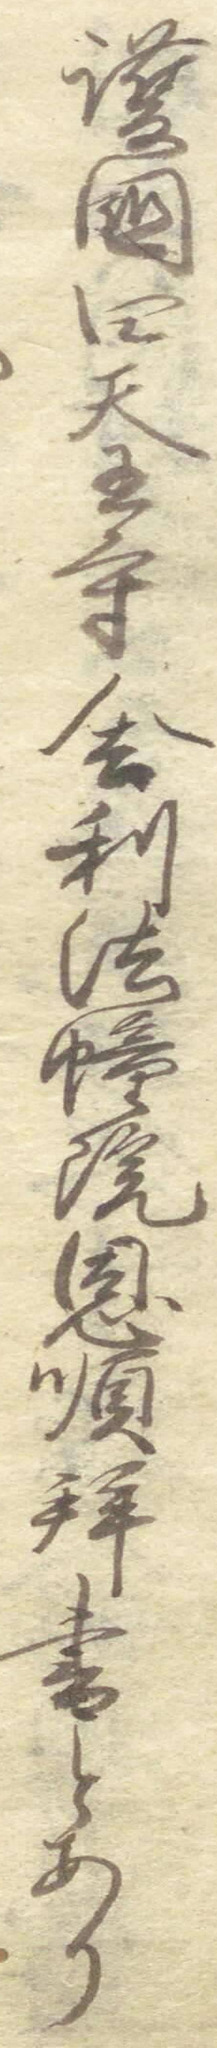護国四天王寺舎利法幢院恩順拝書とあり
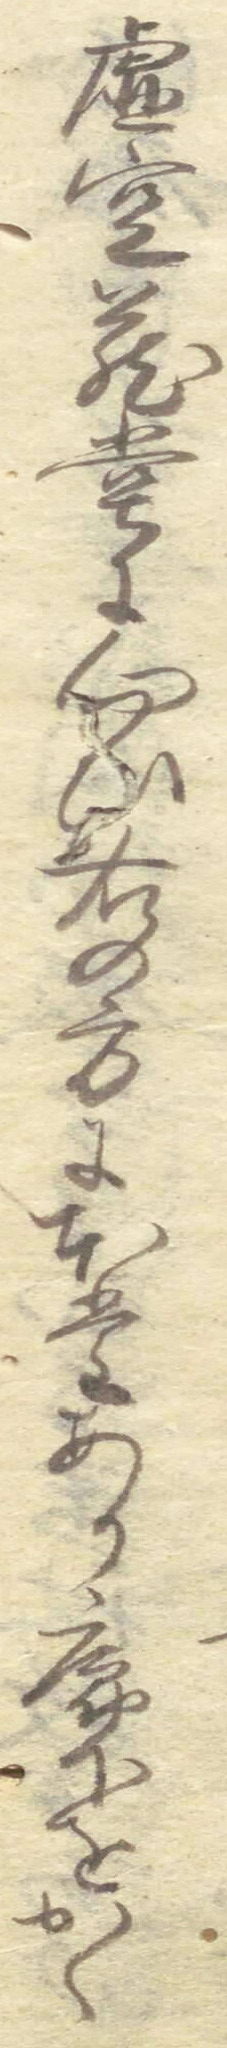虚空蔵堂に向ひ右の方に本堂あり廊下をかく
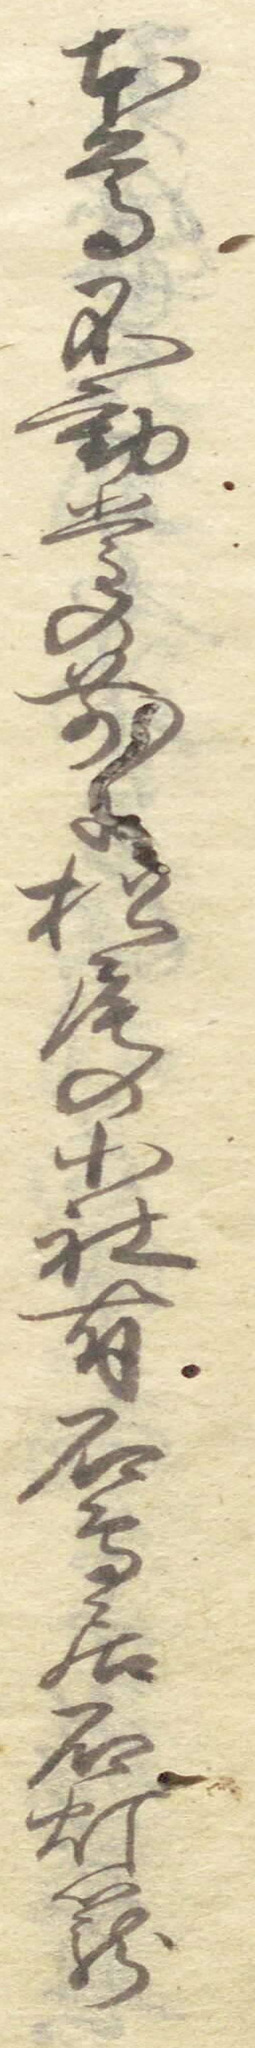本尊不動堂の前に松尾の小社有石鳥居石灯籠
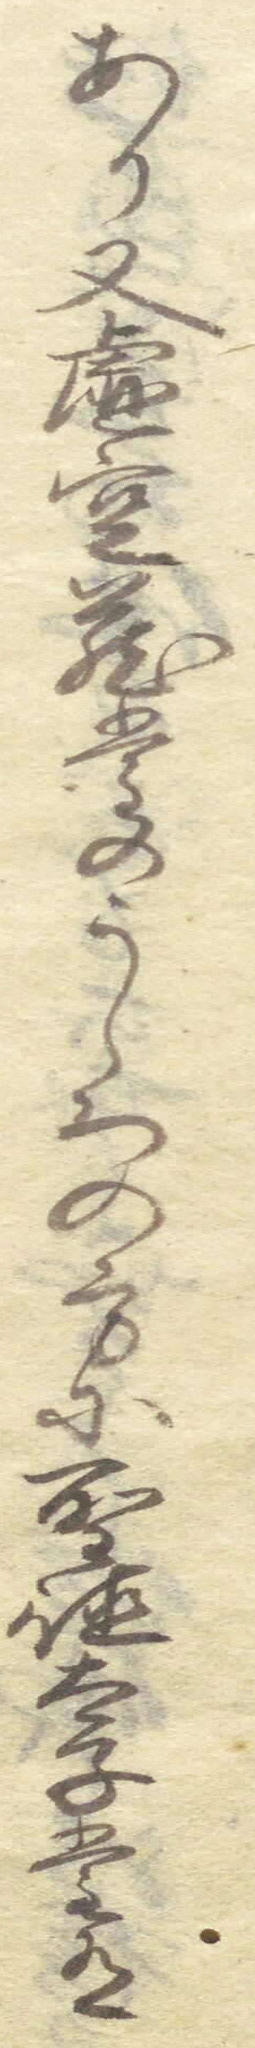あり又虚空蔵堂のうしろの方に聖徳太子堂有
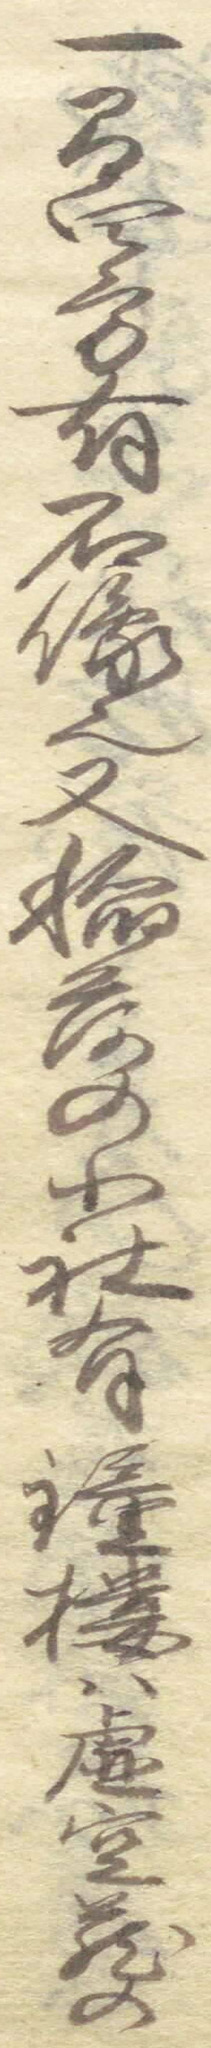一間四方有石像也又稲荷の小社有鐘楼は虚空蔵の
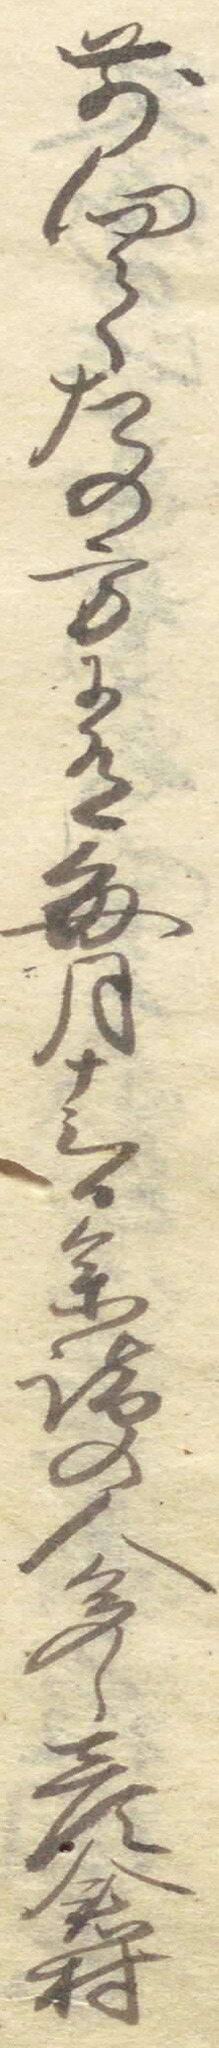前向て左の方に有毎月十三日参詣の人多し彦倉村
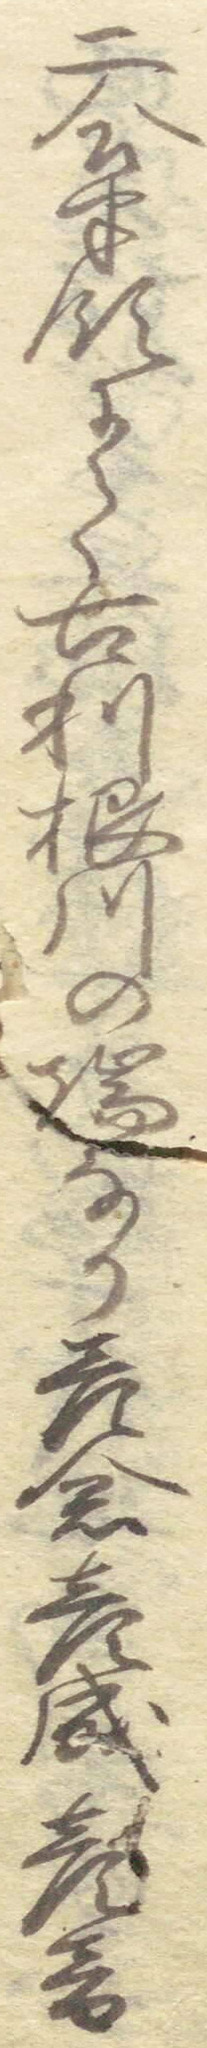二合半領にて古利根川の端なり差倉彦音
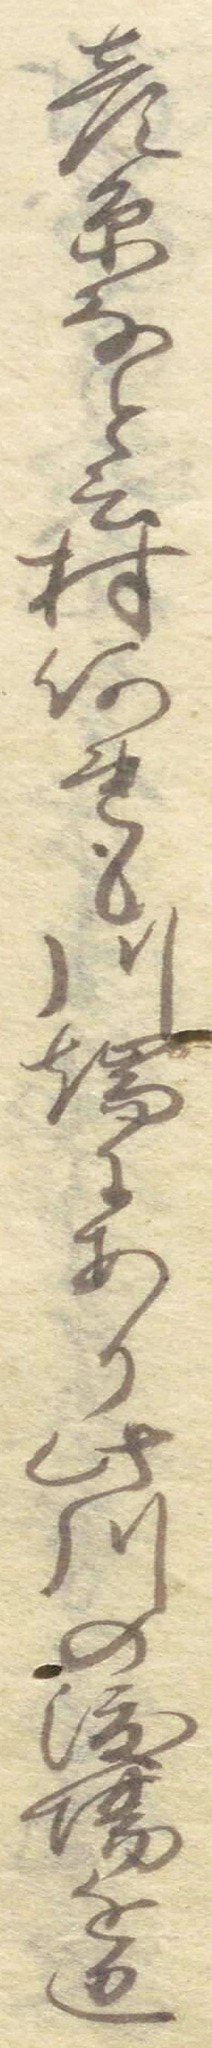彦糸なと云村何れも川端にあり此川の渡場近辺
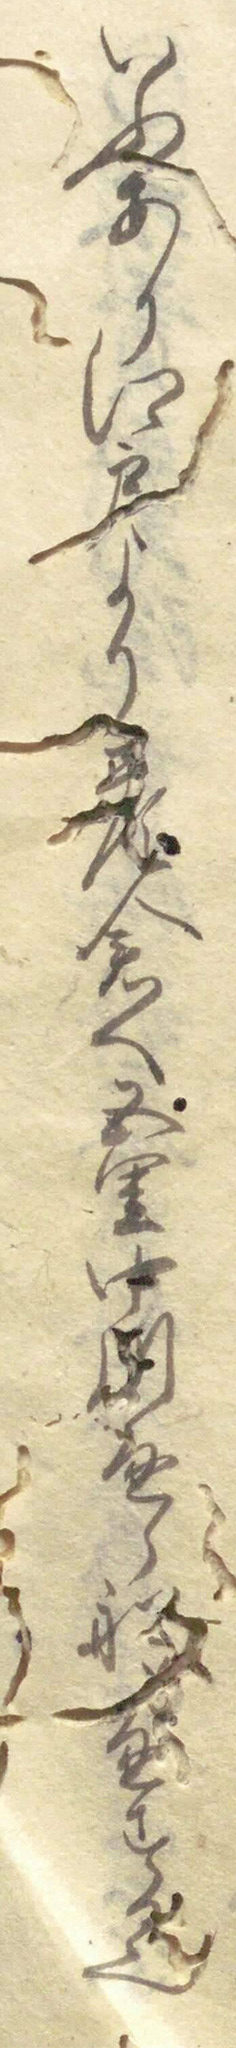いふあり江戸より彦倉へ中川通り船も通する也
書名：四神社閣記
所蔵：茨城大学附属図書館 国文学研究資料館
